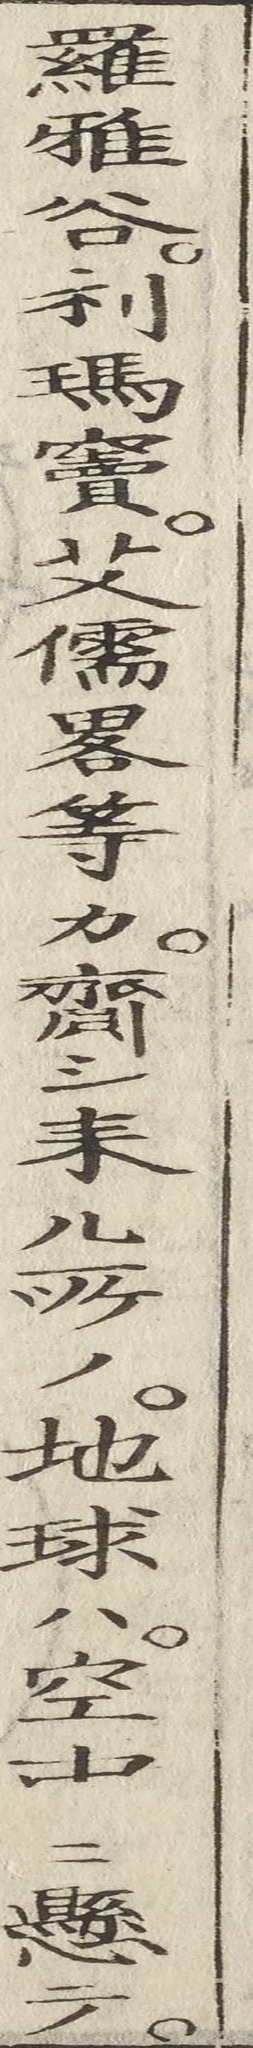羅雅谷。利瑪宝、艾儒略等カ。齊シ来ル所ノ。地球ハ。空中ニ懸テ。
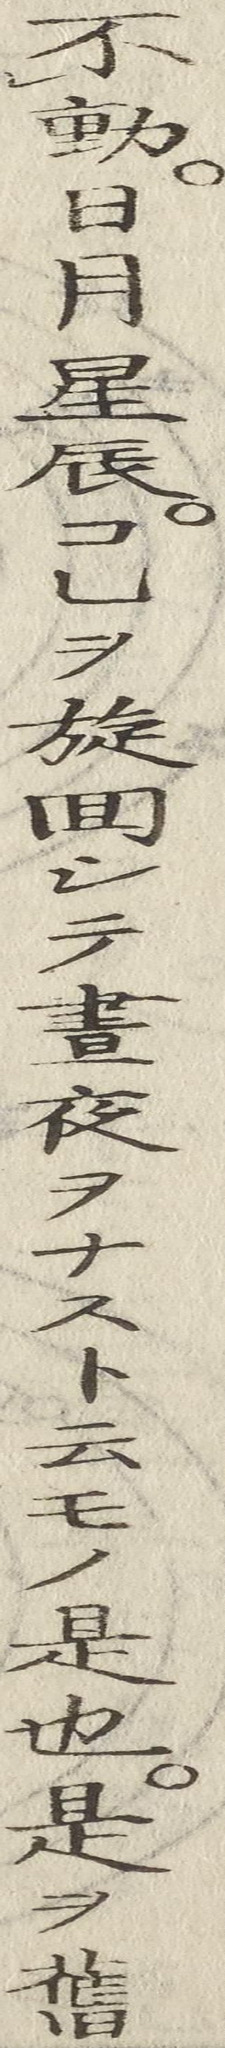不動。日月星辰。コレヲ旋回シテ昼夜ヲナスト云モノ是也。是ヲ旧
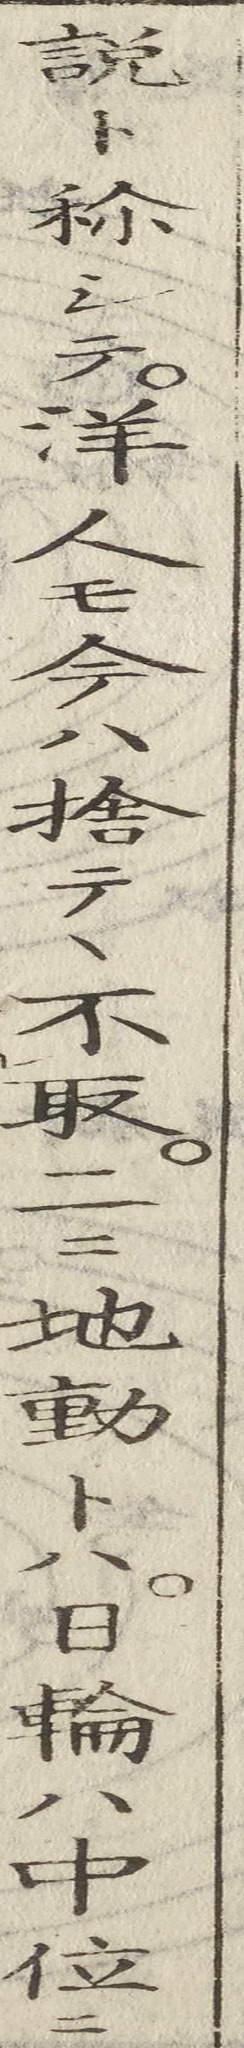説ト称シテ。洋人モ今ハ捨テヽ不取。二ニ地動トハ。日輪ハ中位ニ
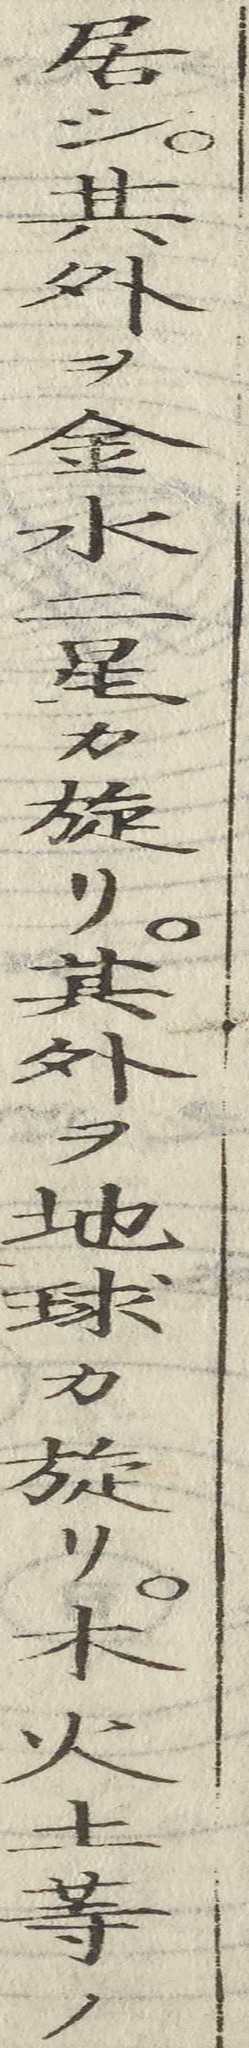居シ。其外ヲ金水二星カ旋リ。其外ヲ地球カ旋リ。木火土等ノ
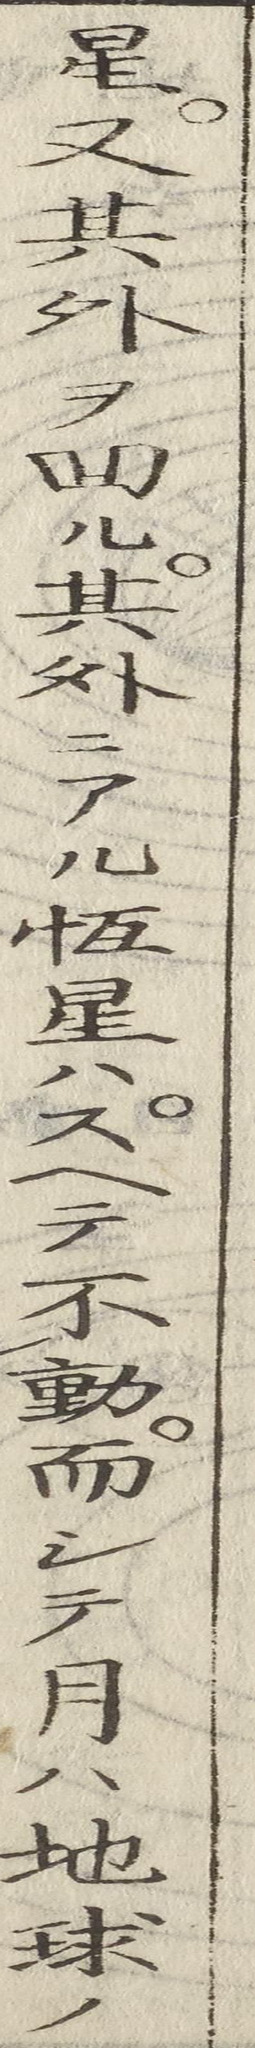星。又其外ヲ回ル。其外ニアル恆星ハ。スヘテ不動。而シテ月ハ地球ノ
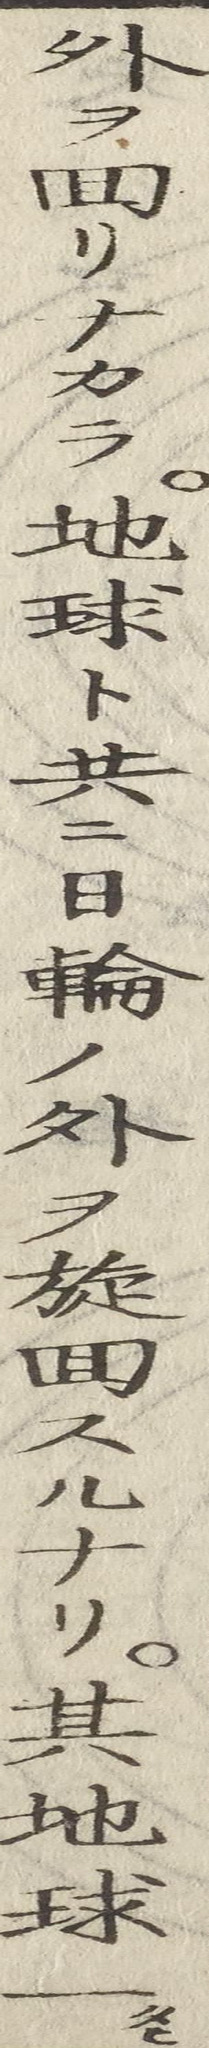外ヲ回リナカラ。地球ト共ニ日輪ノ外ヲ旋回スルナリ。其地球一
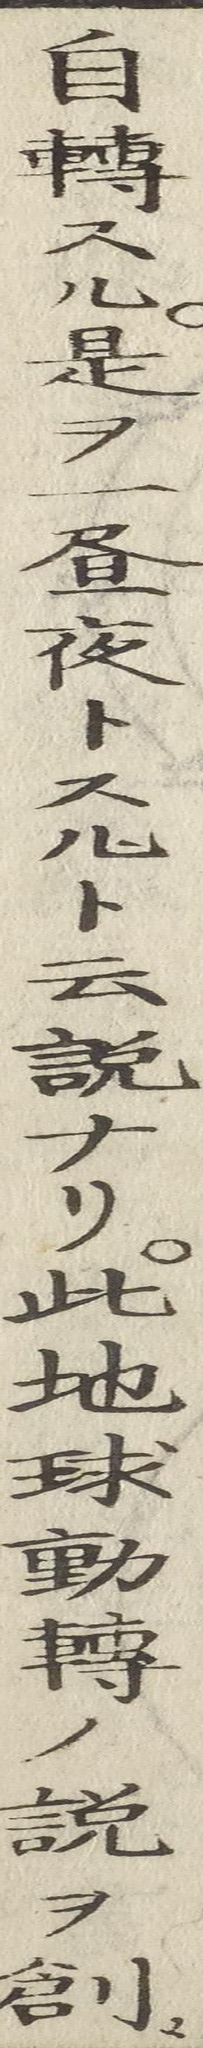自転スル。是ヲ一昼夜トスルト云説ナリ。此地球動転ノ説ヲ創

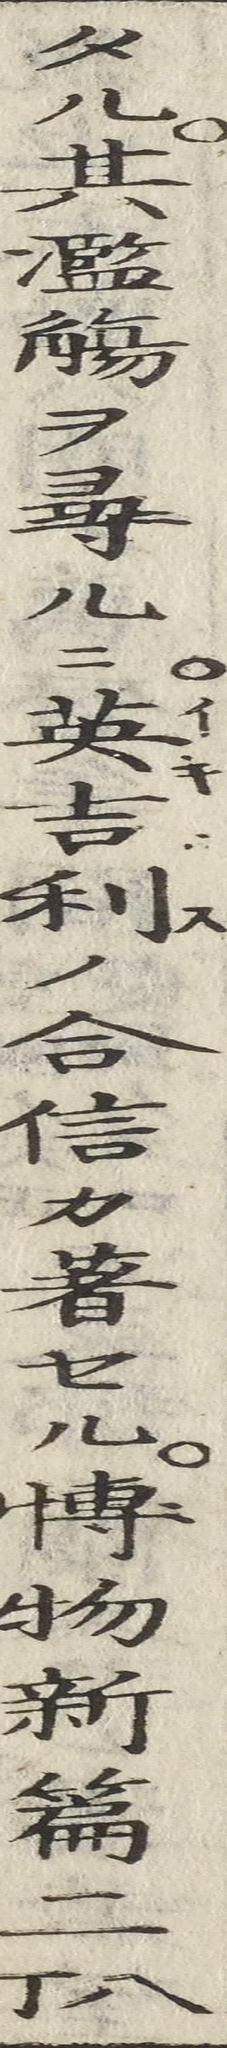タル。濫觴ヲ尋ルニ。英吉利ノ合信カ著セル。博物新篇ニ八丁
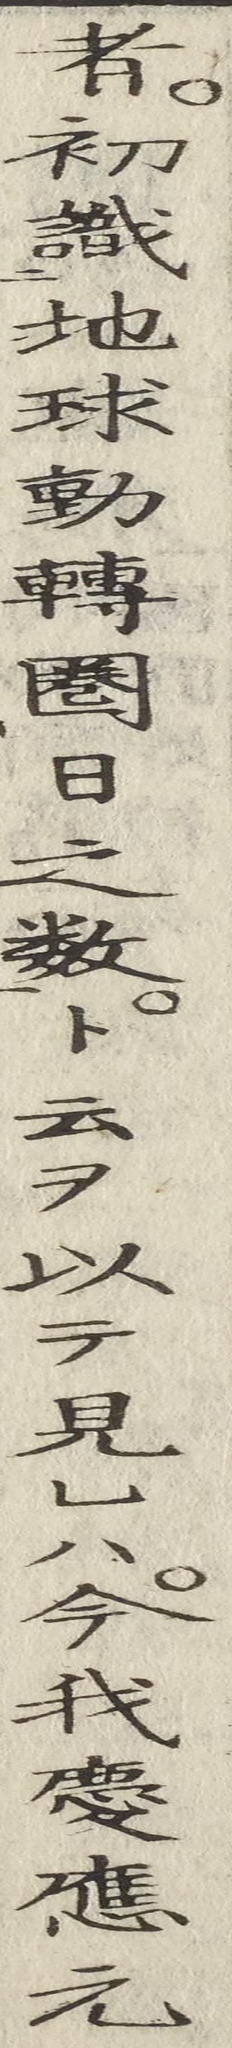者。初識地球動転圏－日之数。ト云ヲ以テ見レハ。今我慶応元
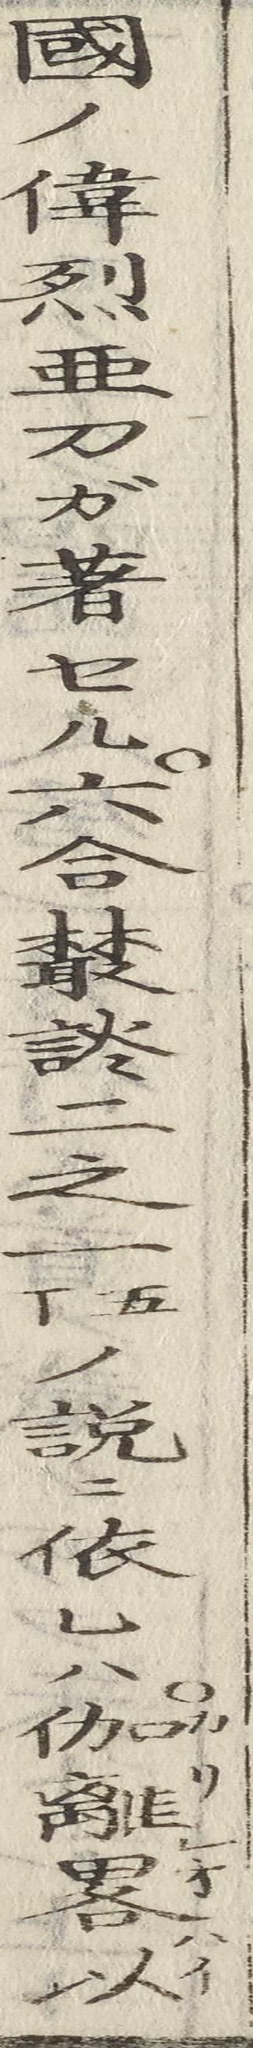国ノ偉烈亜刀ガ著セル。六合樷談二之一五丁ノ説ニ依レハ。伽離略以
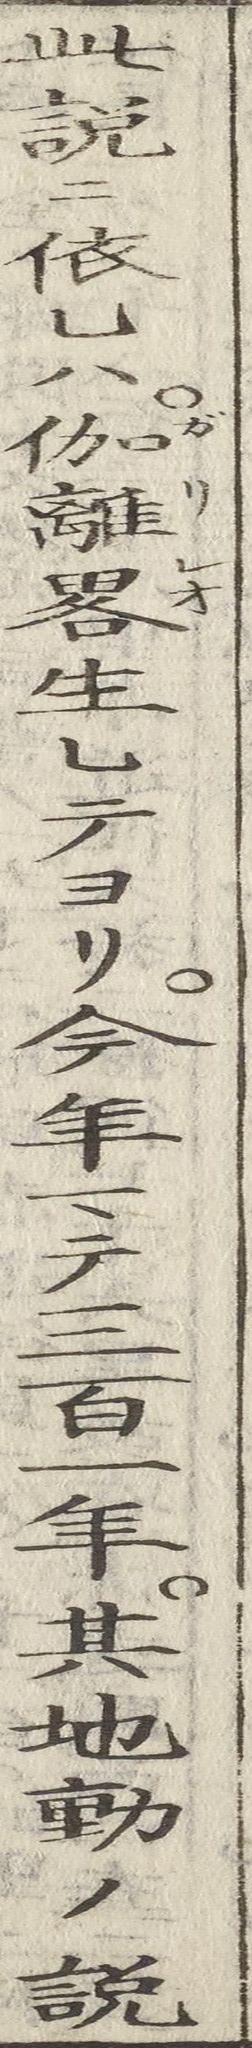此説ニ依レハ。伽離略生レテヨリ。今年マテ三百一年。其地動ノ説
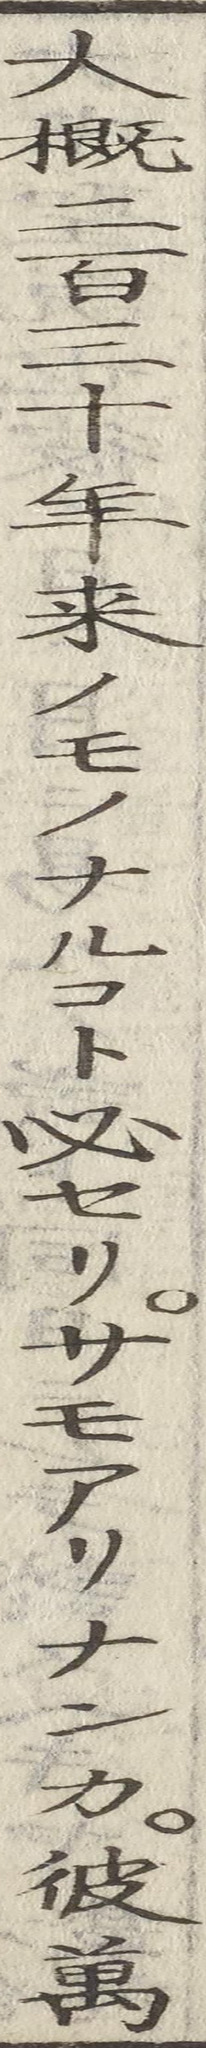大概二百三十年来ノモノナルコト必セリ。サモアリナンカ。彼万
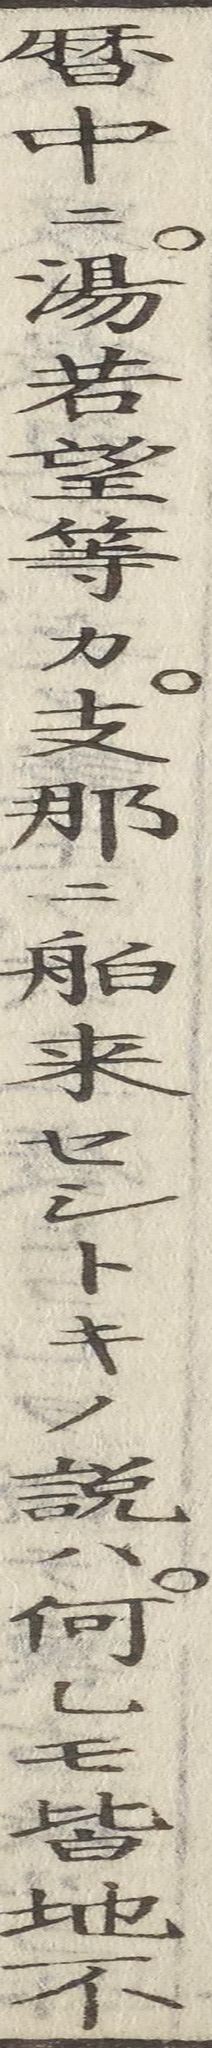暦中ニ。湯若望等カ。支那ニ舶来セシトキノ説ハ。何レモ皆地不
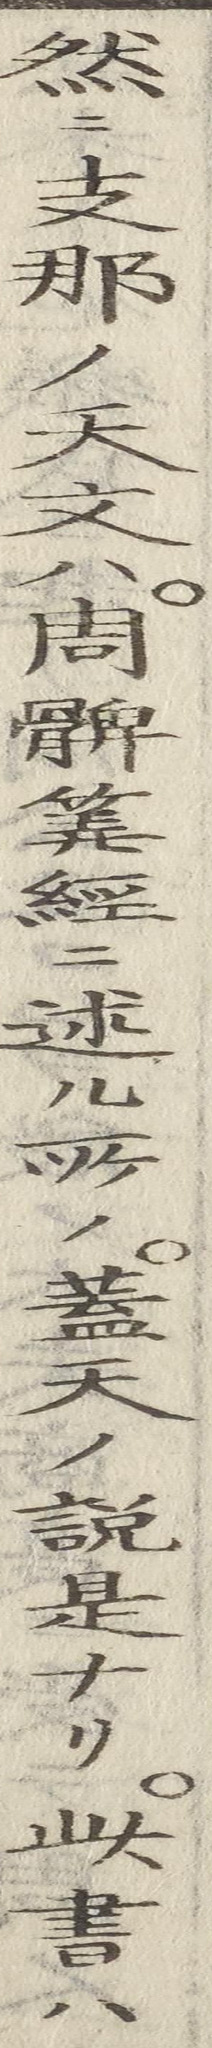然ニ支那ノ天文ハ。周髀筭経ニ述ル所ノ蓋天ノ説是ナリ。此書ハ

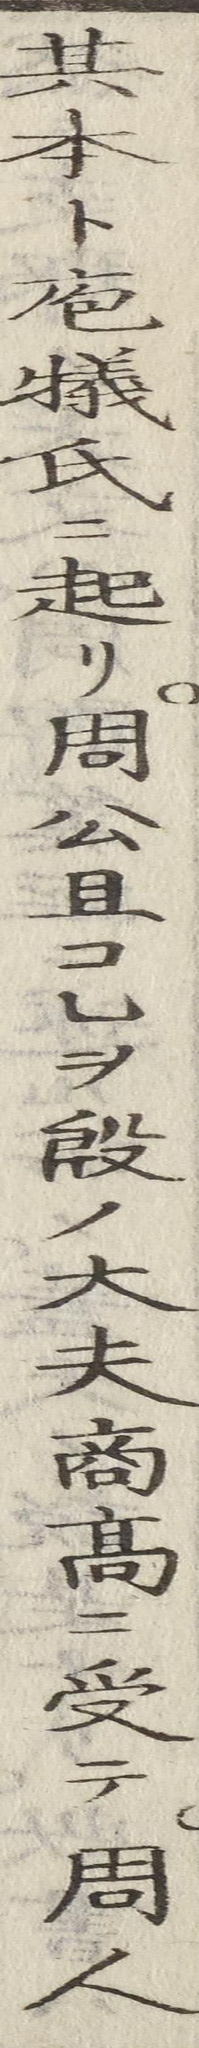其本ト庖犠氏ニ起リ。周公旦コレヲ殷ノ大夫商高ニ受テ。周人
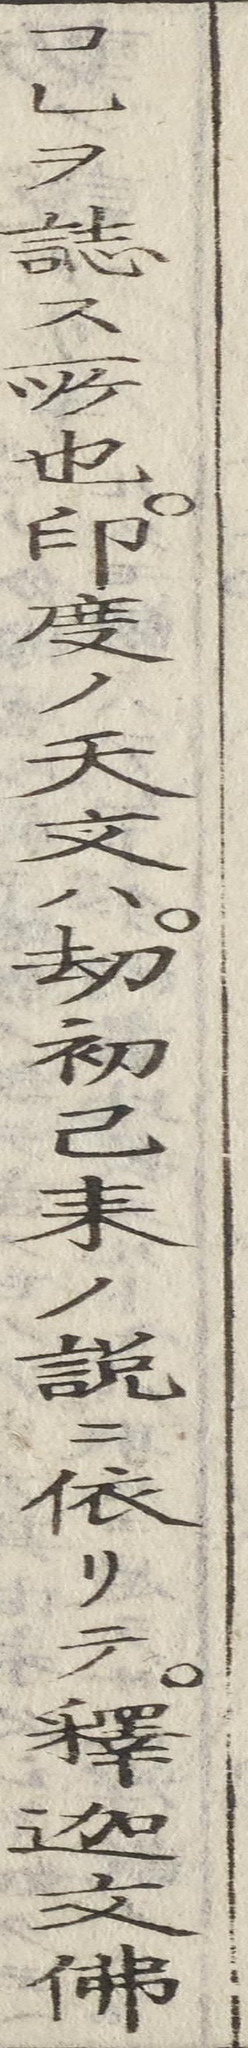コレヲ誌ス所也。印度ノ天文ハ。却初己来ノ説ニ依リテ。釋迦文仏
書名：護法新論　中
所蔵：東京大学地震研究所図書室 Earthquake Research Institute Library, The University of Tokyo, JAPAN
